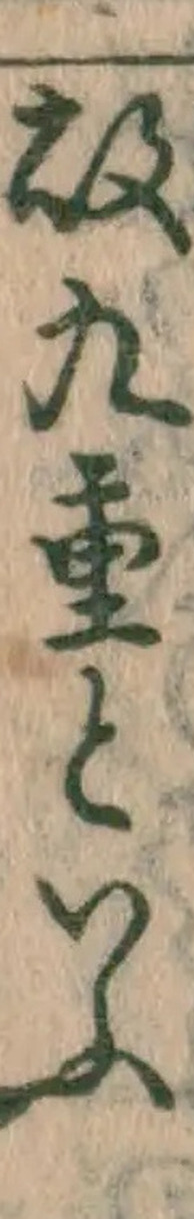故九重といふ
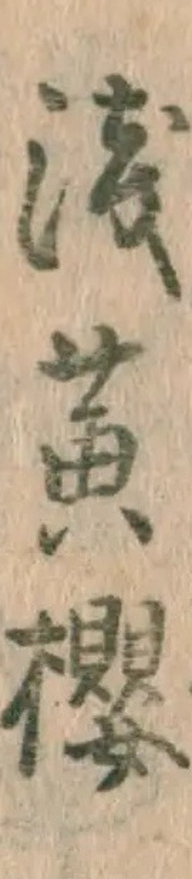浅黄桜
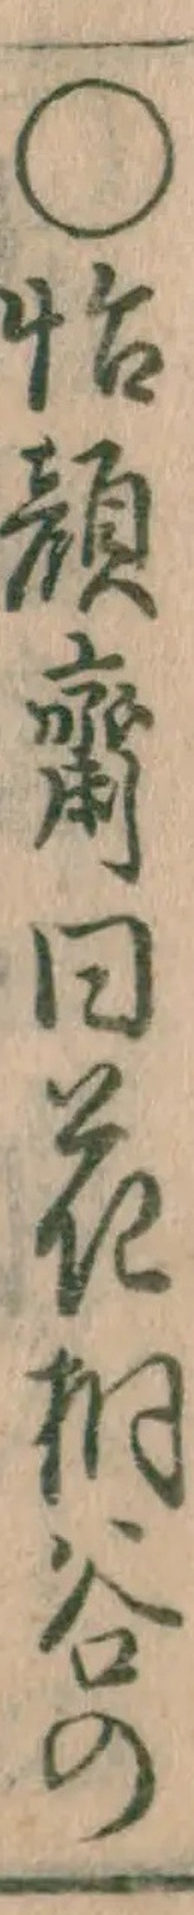○怡顔斎曰花桐谷の
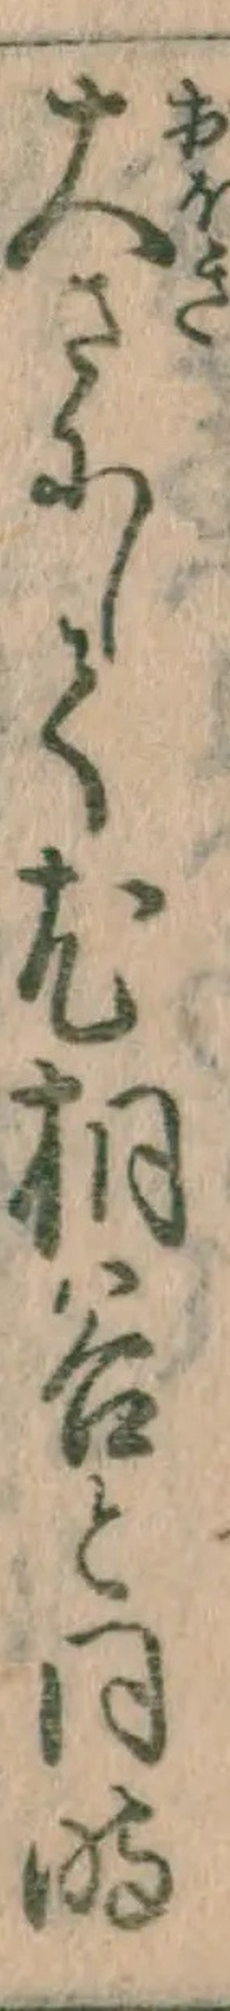大きさにして尤桐谷と同時
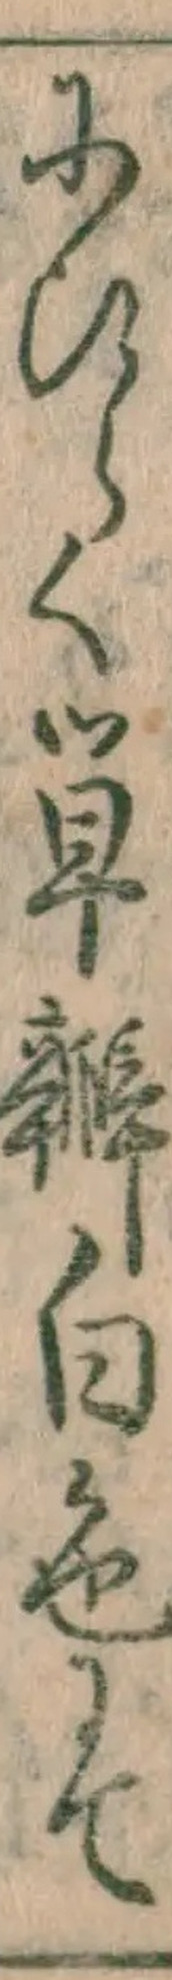にひらく単弁白色にて
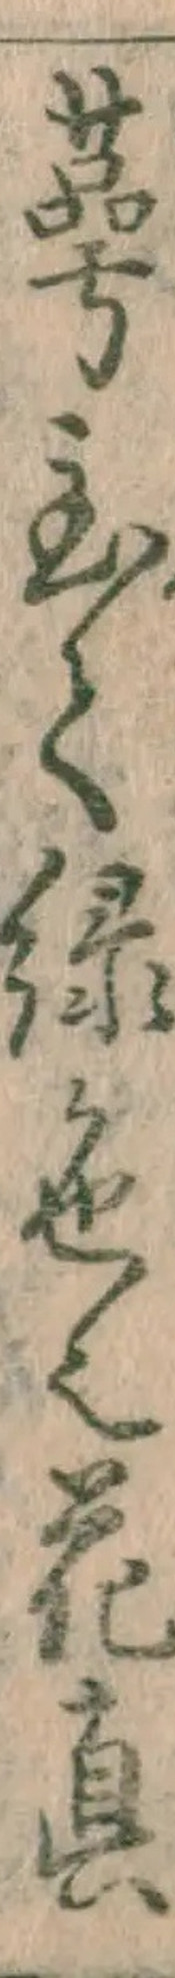萼至て緑色也花真
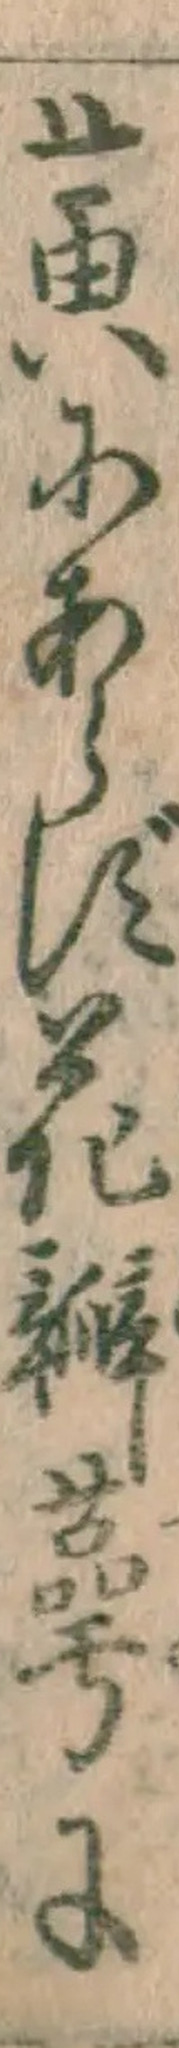黄にあらず花弁萼に
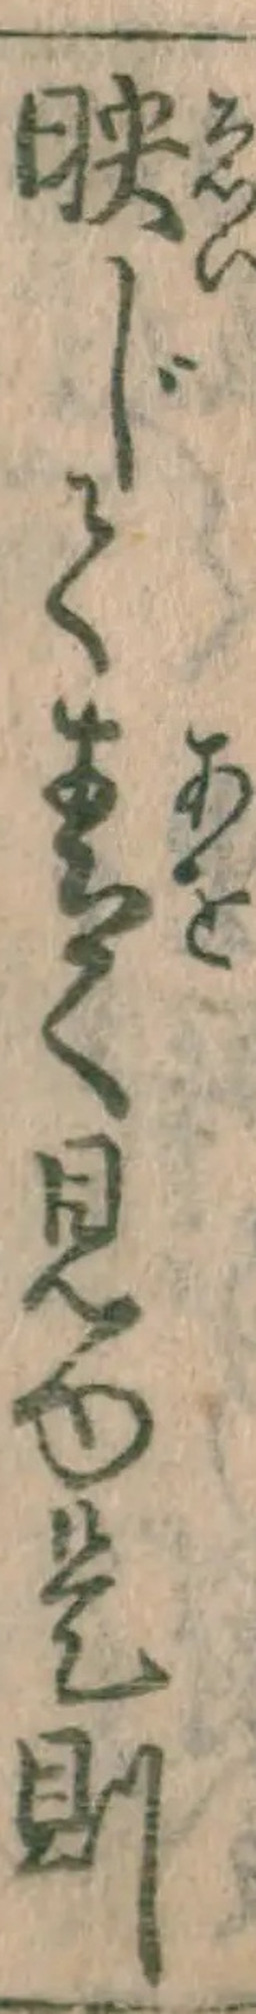映じて青く見ゆ是則
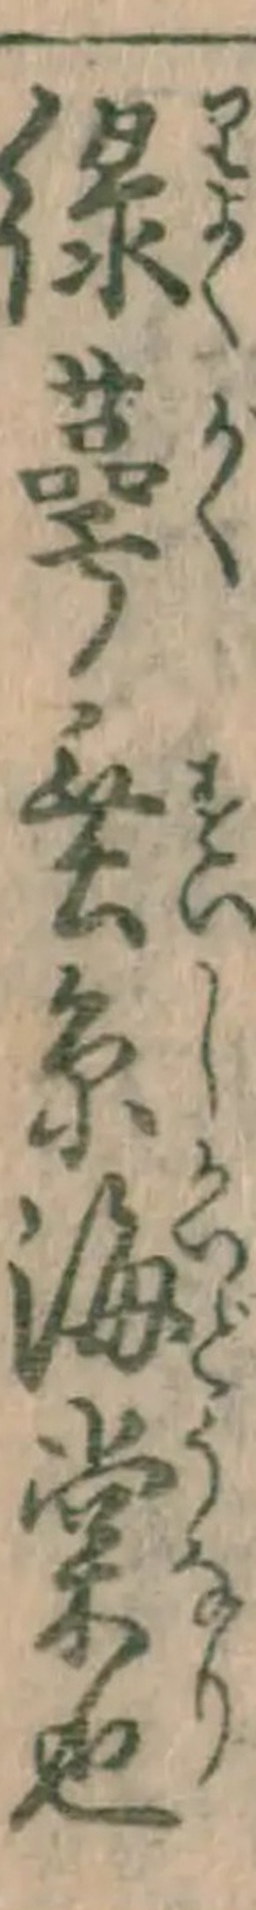緑萼垂糸海棠也

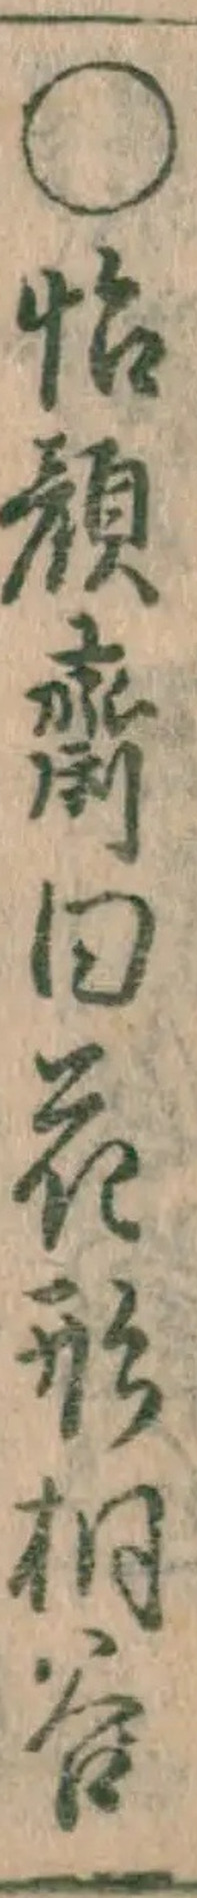○怡顔斎曰花形桐谷
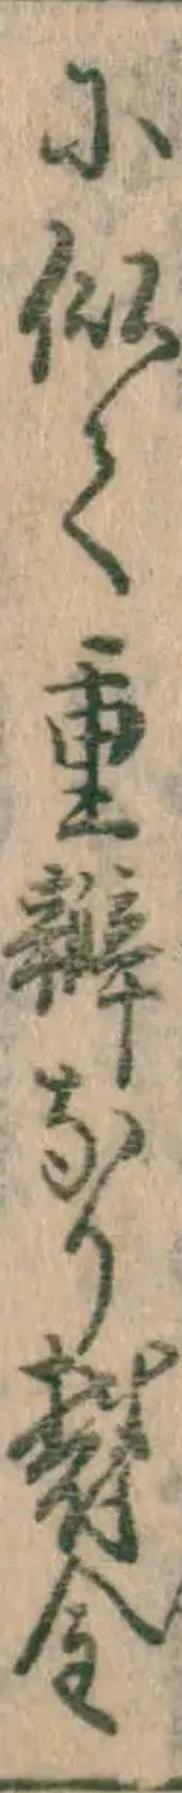に似て重弁なり鬱金
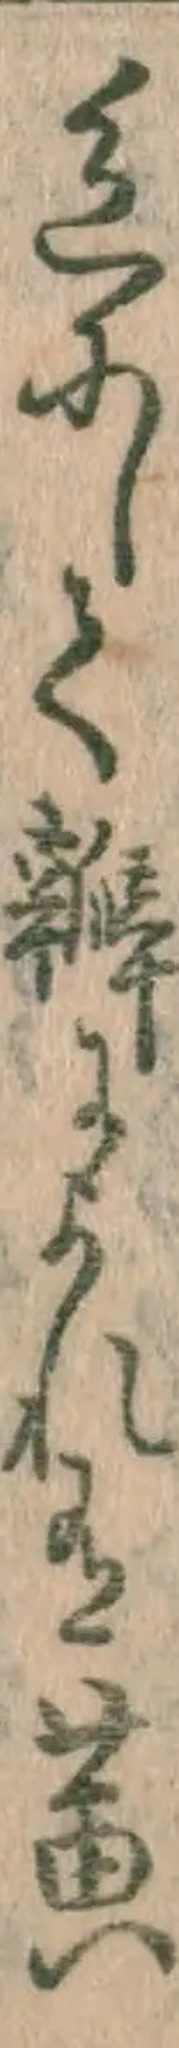色にして弁によれ有黄
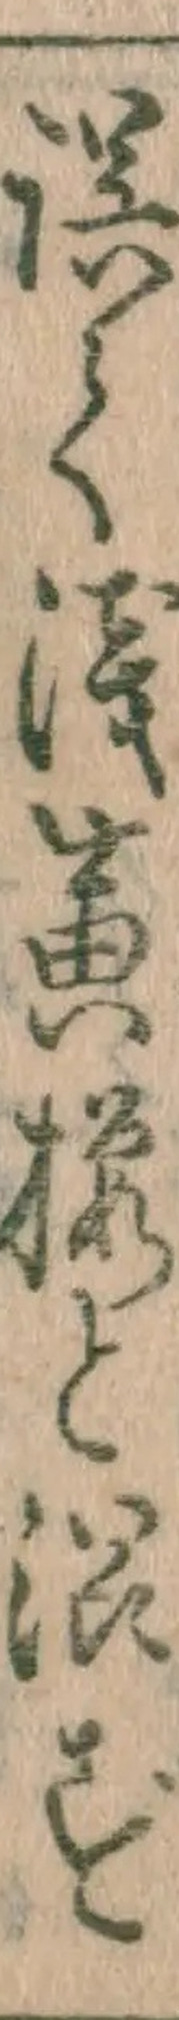誤て浅黄桜と混ず
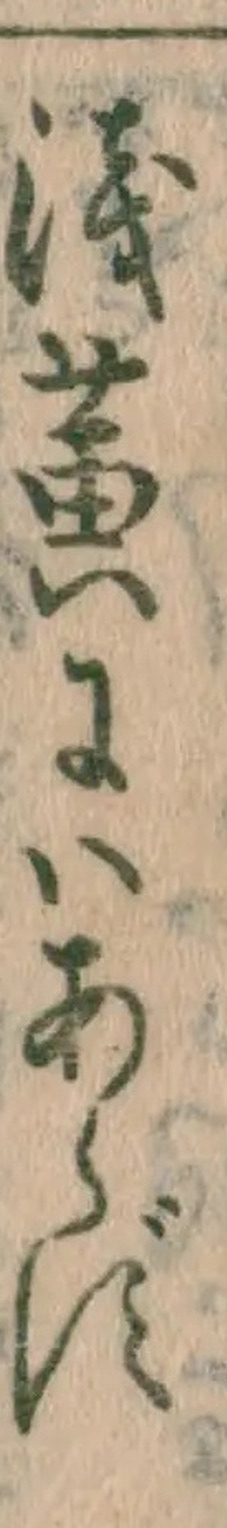浅黄にはあらず
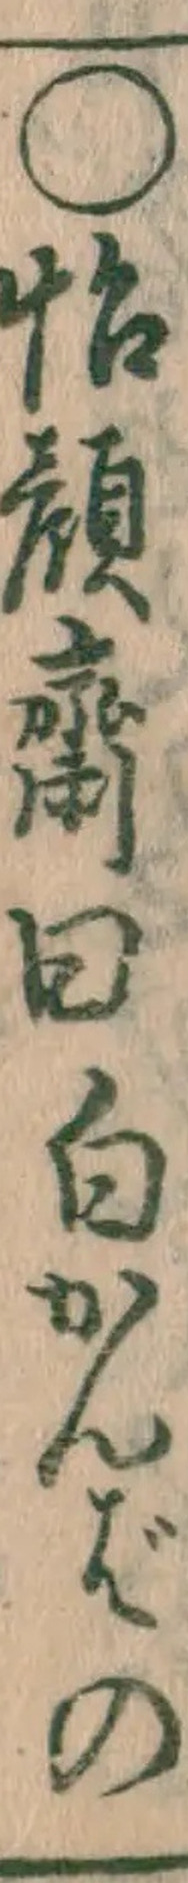○怡顔斎曰白かんばの
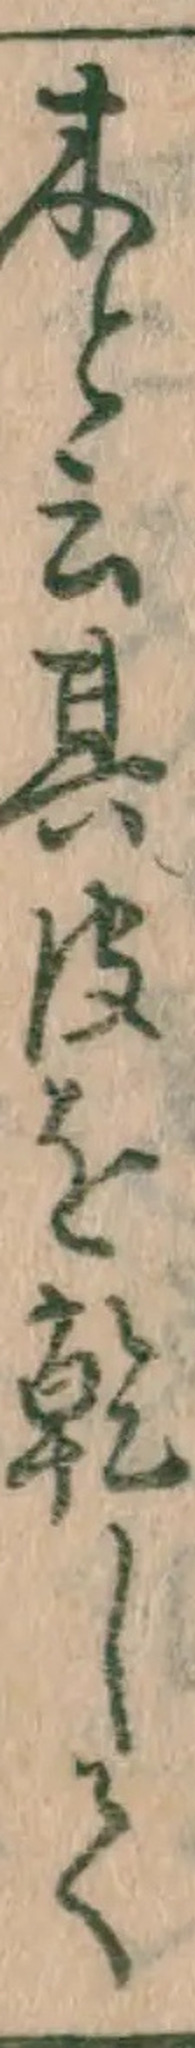木と云其皮を乾して
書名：怡顔齋櫻品
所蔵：国立国会図書館 National Diet Library, JAPAN
